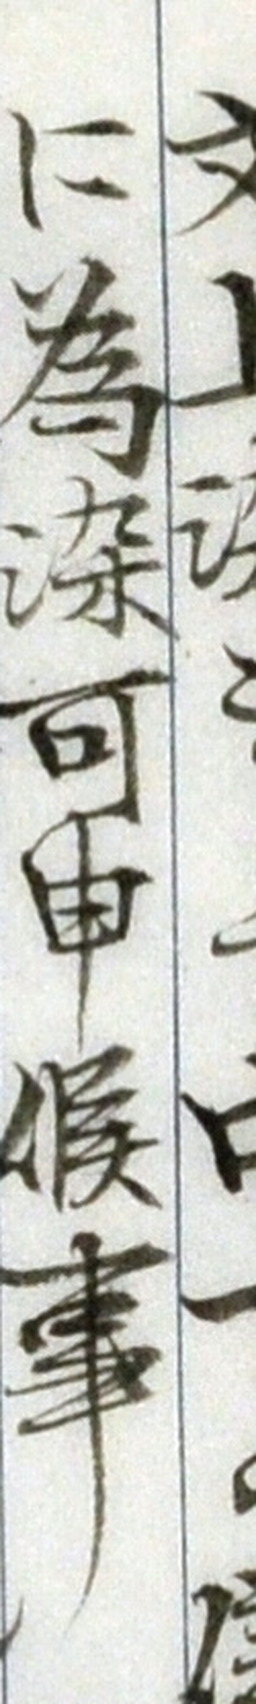に為染可申候事
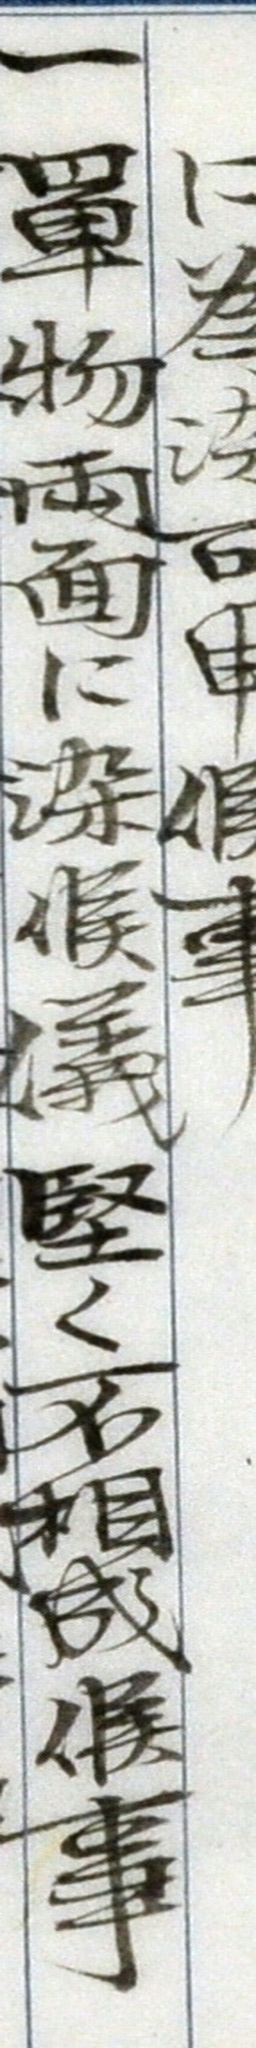一単物両面に染候儀堅く不相成候事
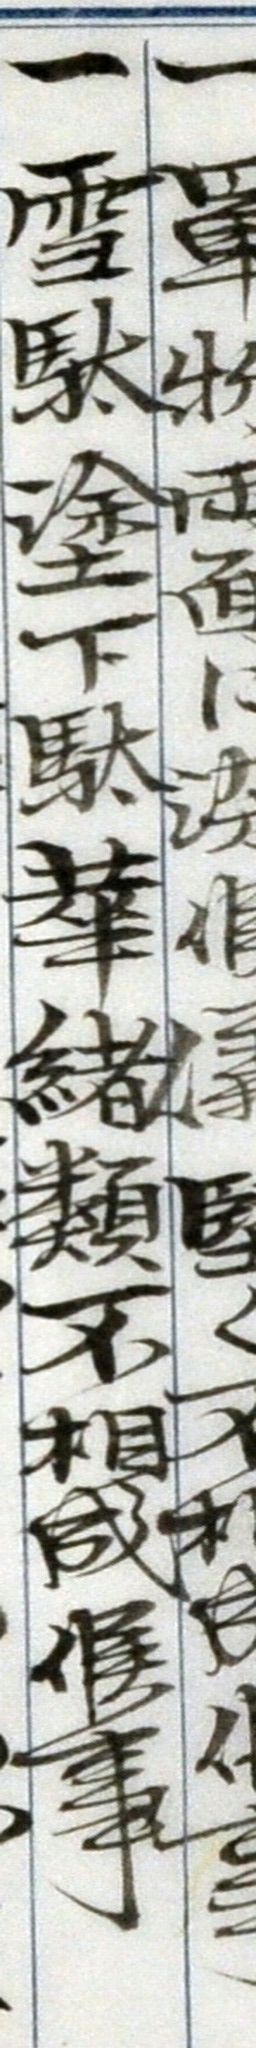一雪駄塗下駄華緒類不相成候事
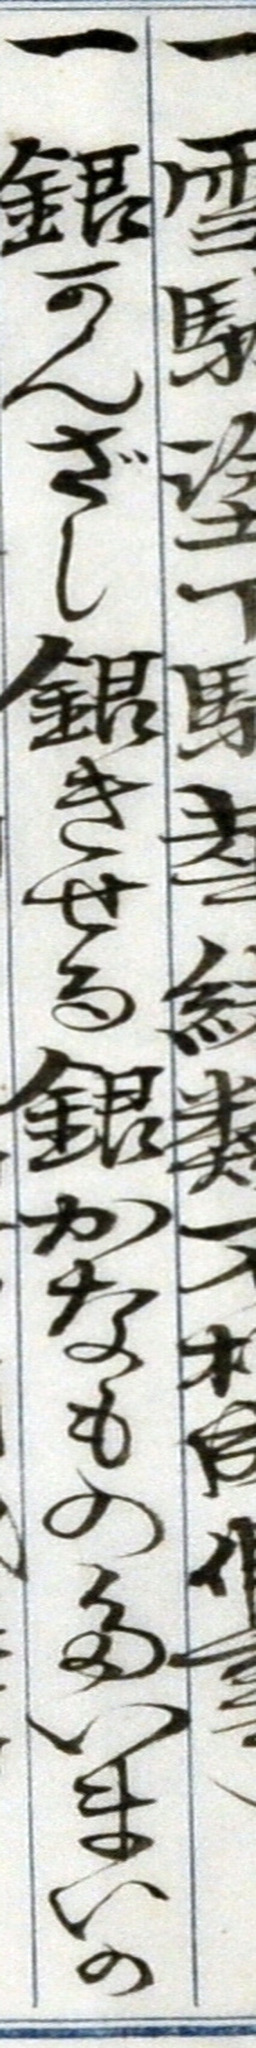一銀かんざし銀きせる銀かなものたいまいの
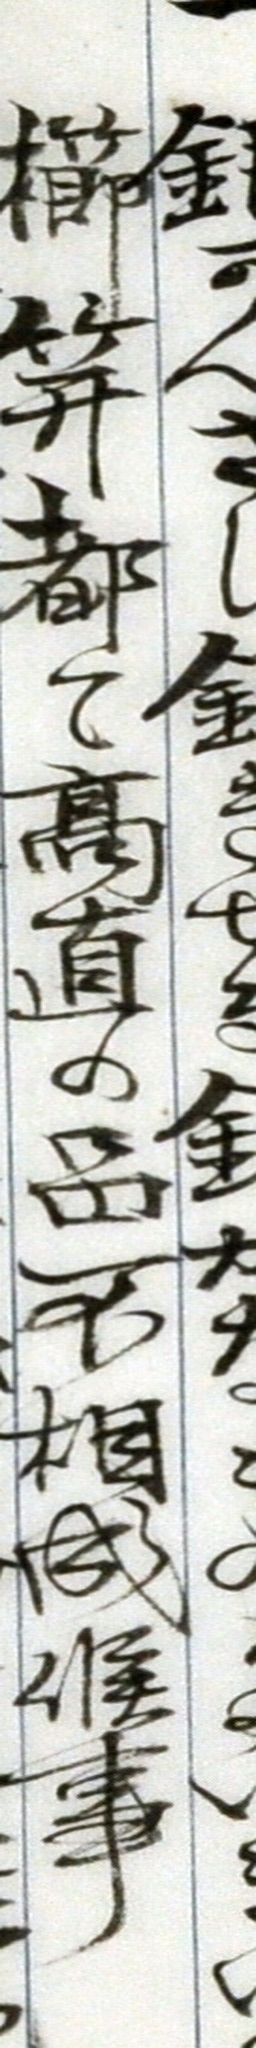櫛笄都て高直の品不相成候事
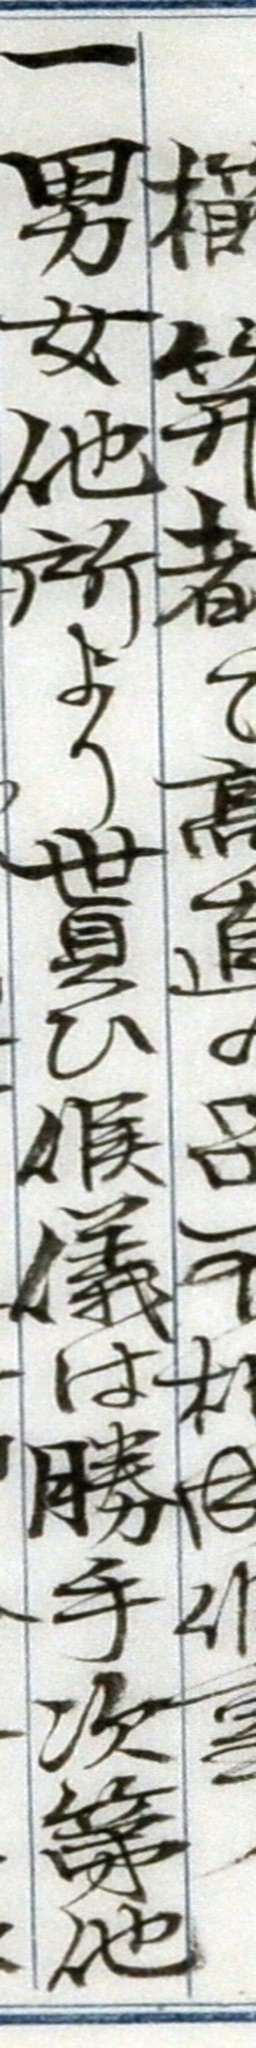一男女他所より貰ひ候儀は勝手次第他
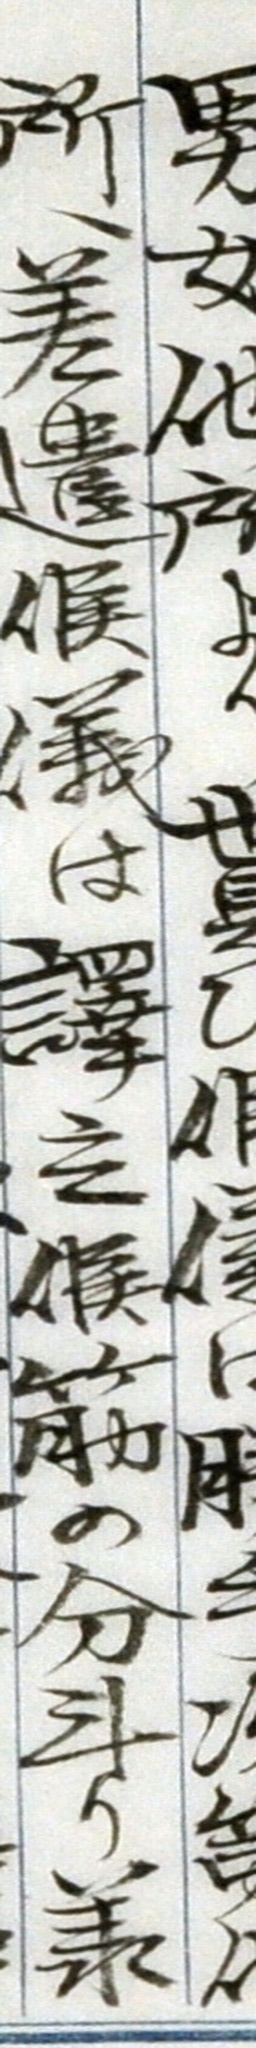所へ差遣候儀は訳立候筋の分斗り承
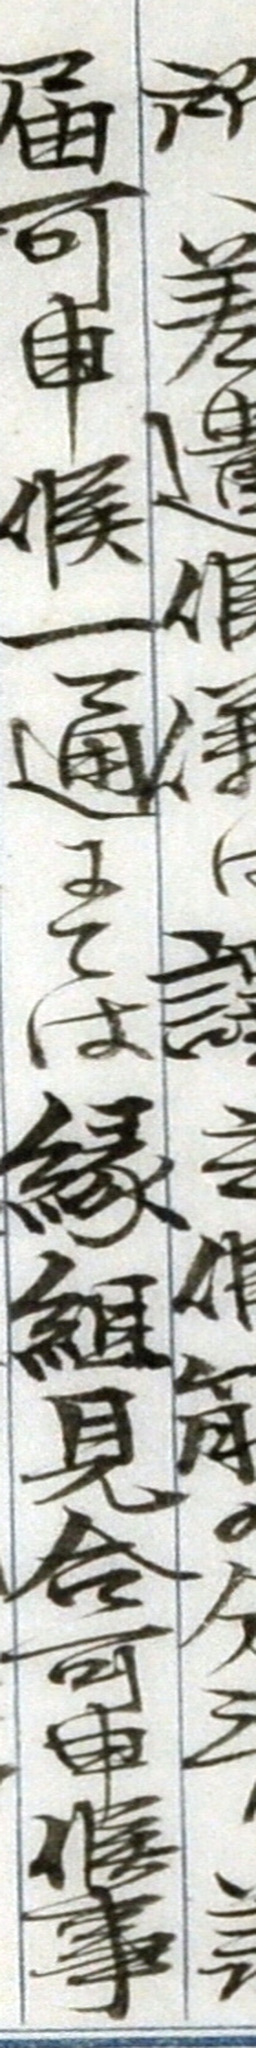届可申候一通にては縁組見合可申候事
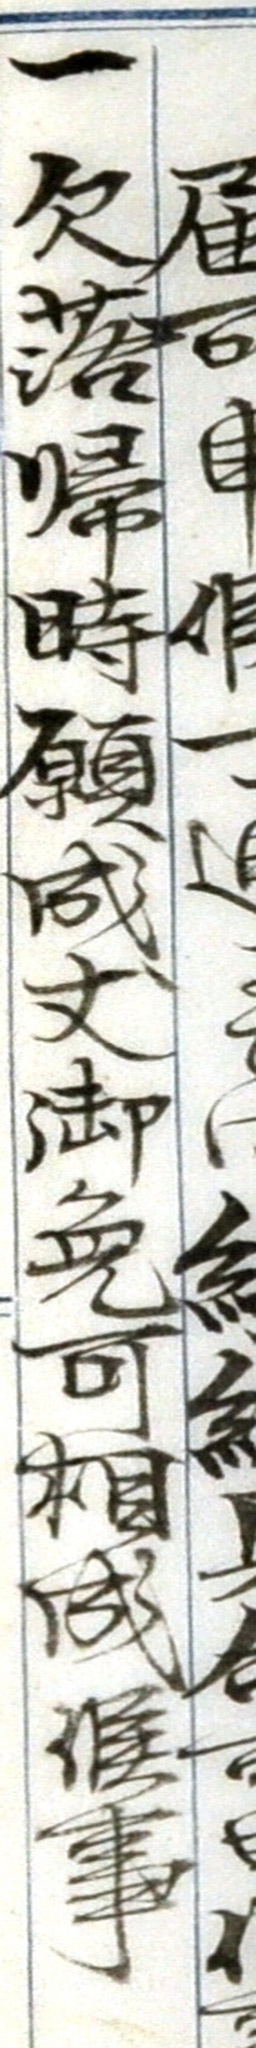一欠落帰時願成丈御免可相成候事

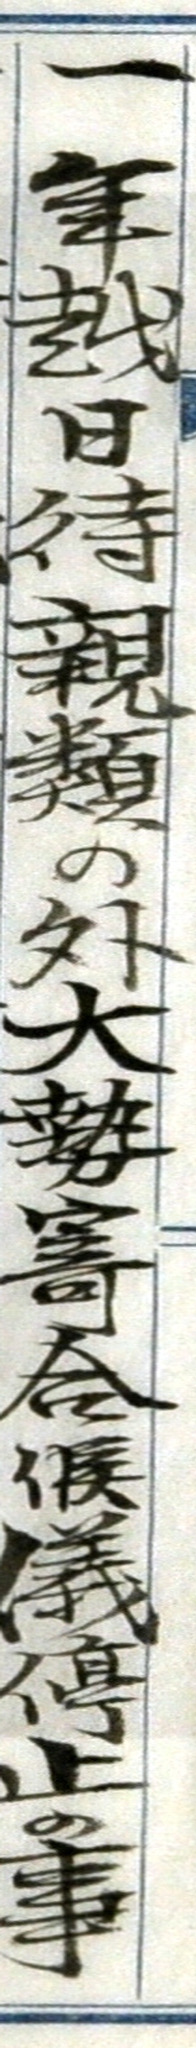一年越日待親類の外大勢寄合候儀停止の事
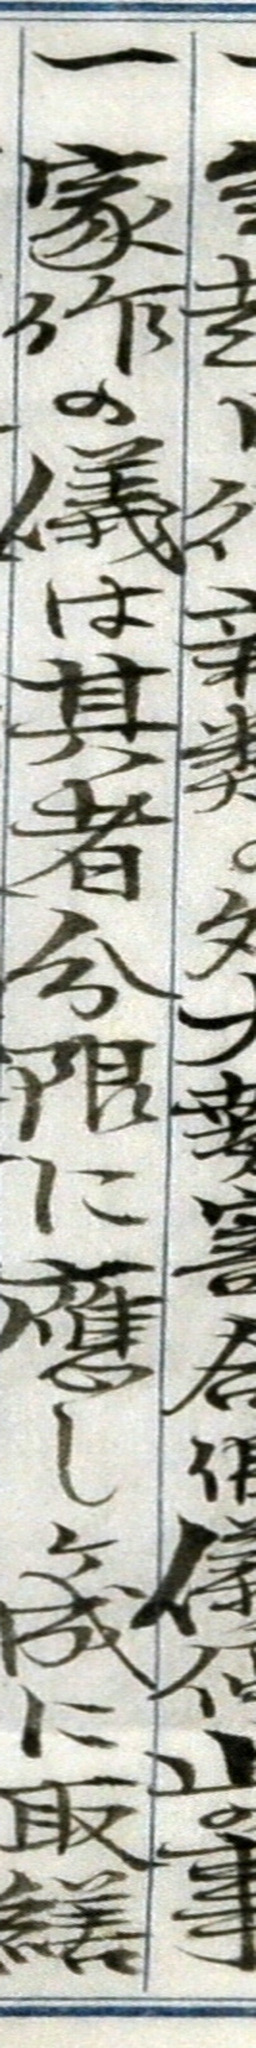一家作の儀は其者分限に応しヶ成に取繕
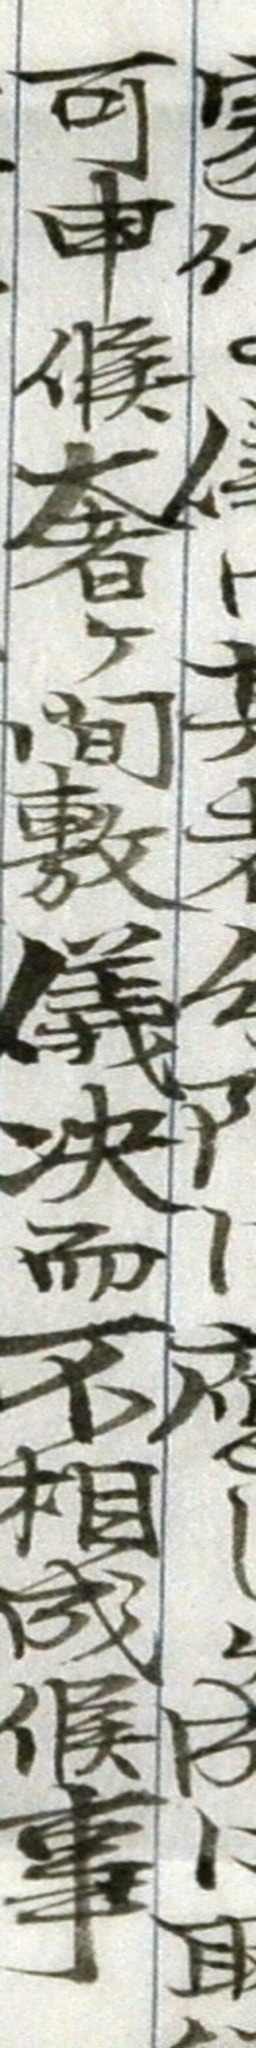可申候奢ヶ間敷儀決而不相成候事
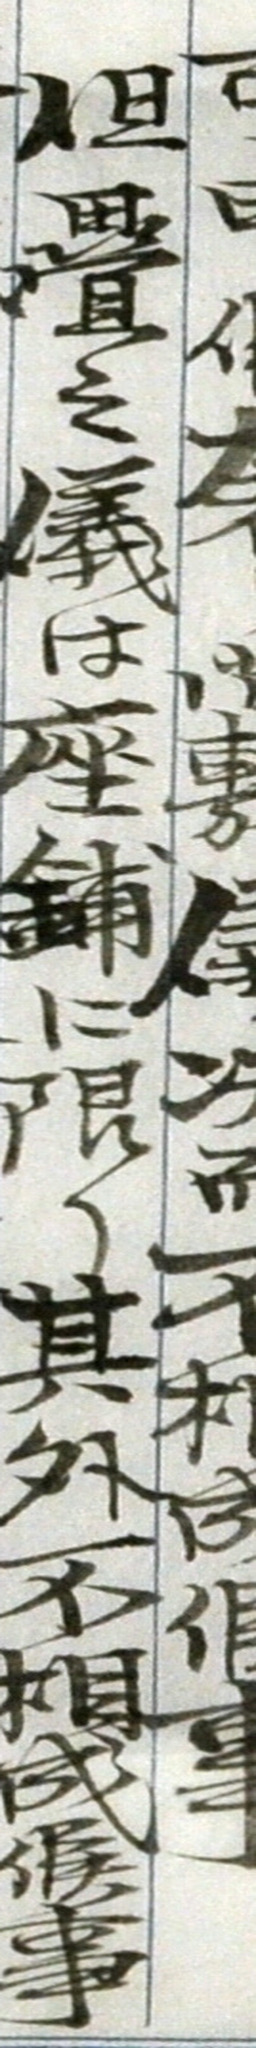但畳之儀は座鋪に限り其外不相成候事
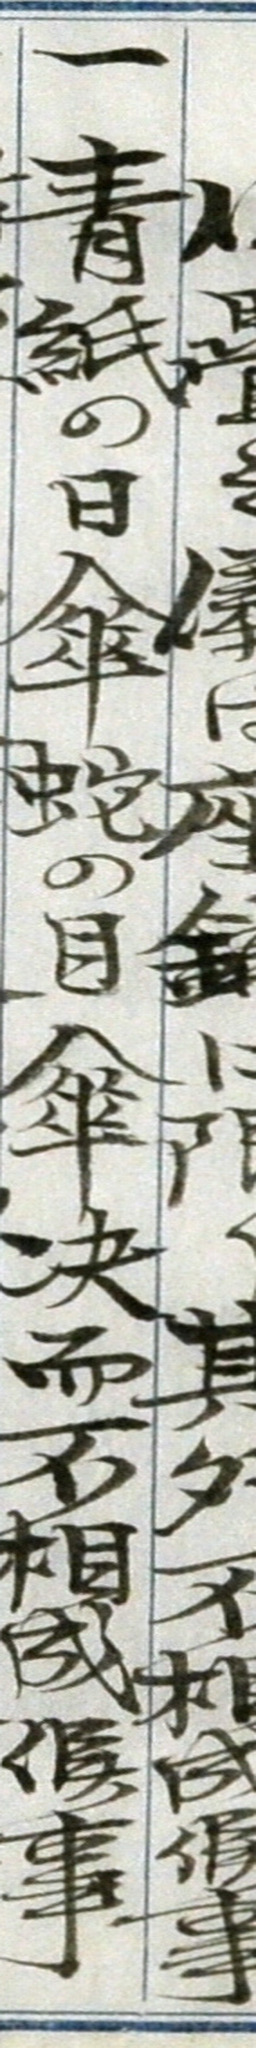一青紙の日傘蛇の目傘決而不相成候事
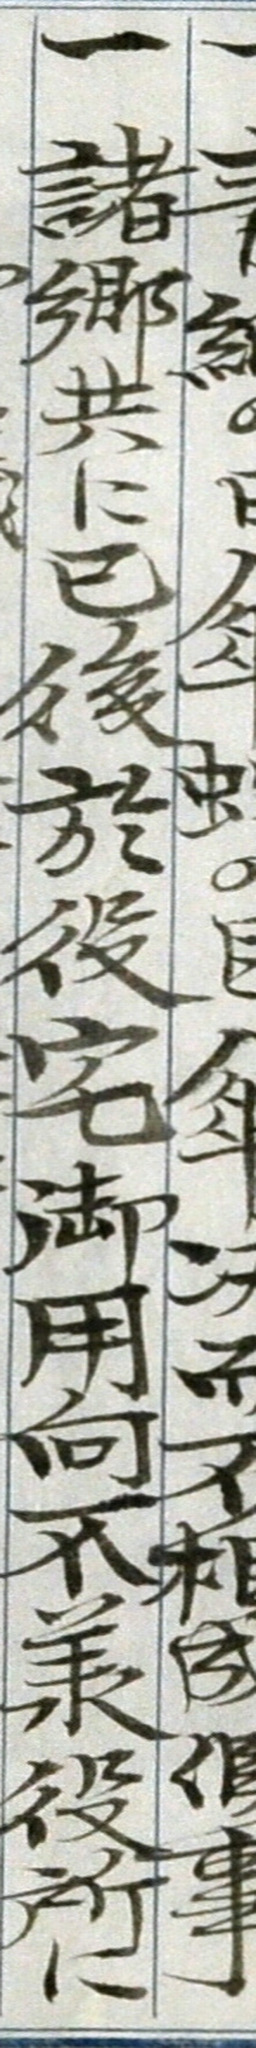一諸郷共に已後於役宅御用向不承役所に
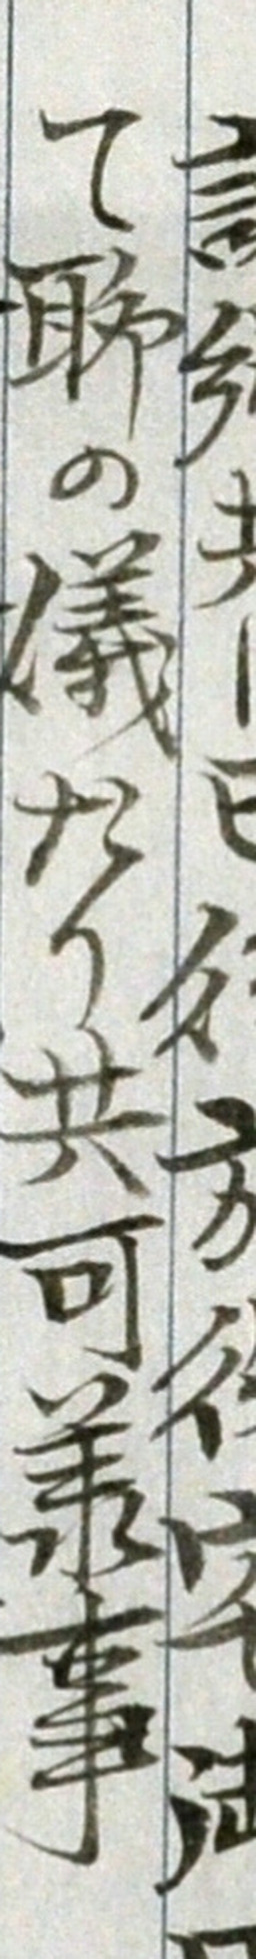て聊の儀たり共可承事
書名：倹約筋御沙汰書
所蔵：伊那市立高遠町図書館・合同会社AMANE
